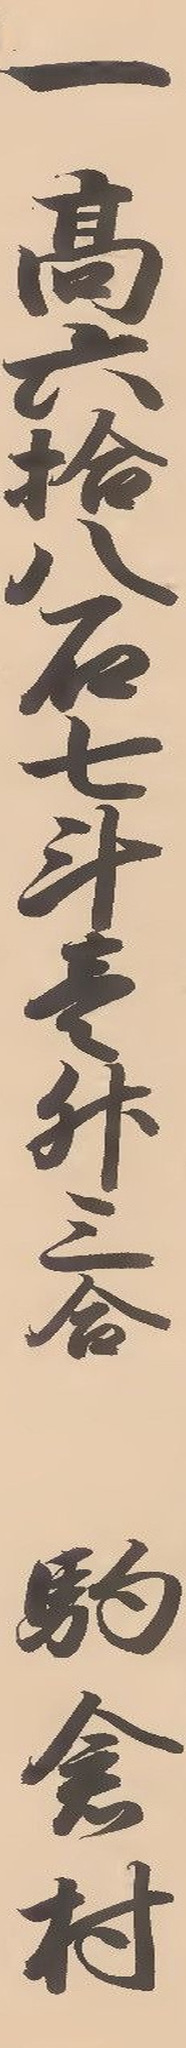一高六拾八石七斗壱升三合駒倉村
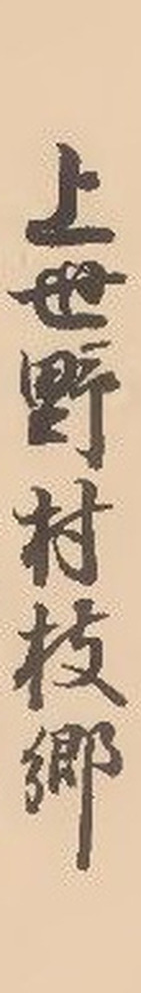上世野村枝郷
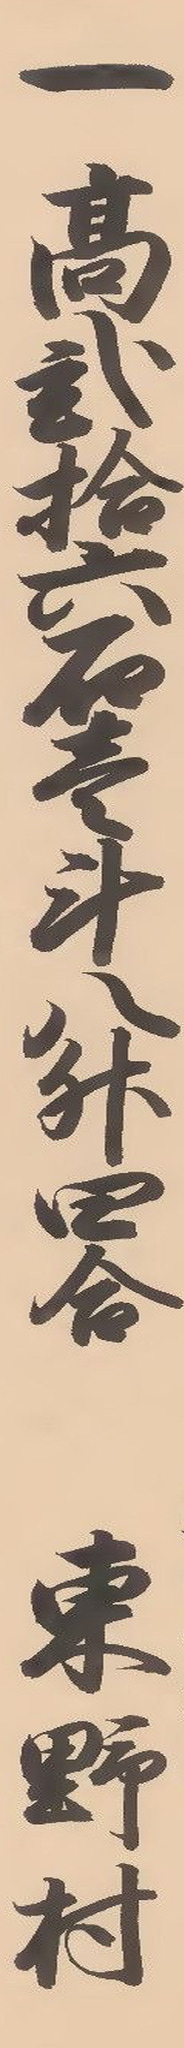一高弐拾六石壱斗八升四合東野村
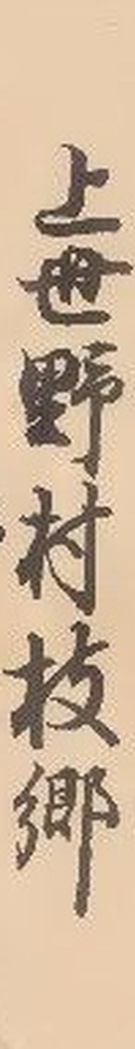上世野村枝郷
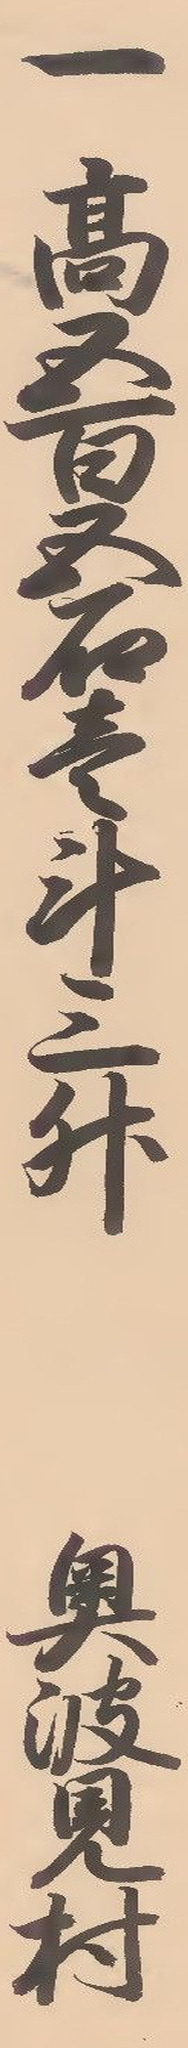一高五百五石壱斗三升奥波見村

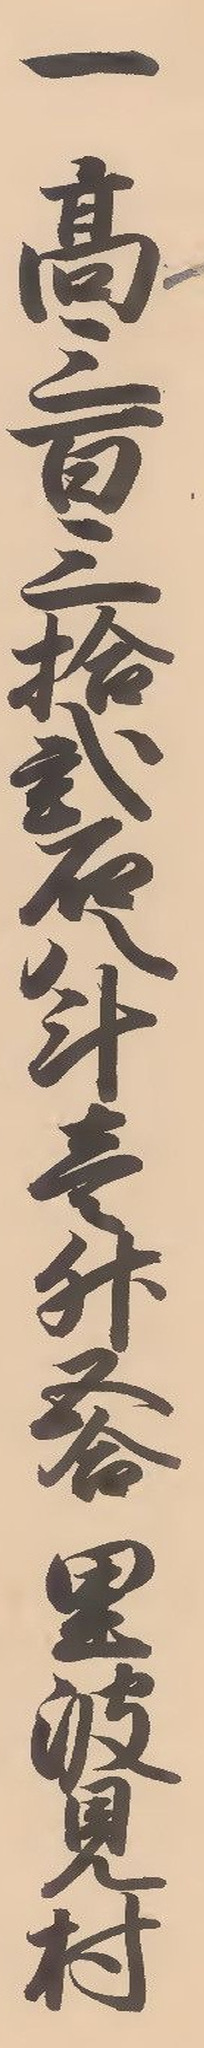一高三百三拾弐石八斗壱升五合里波見村
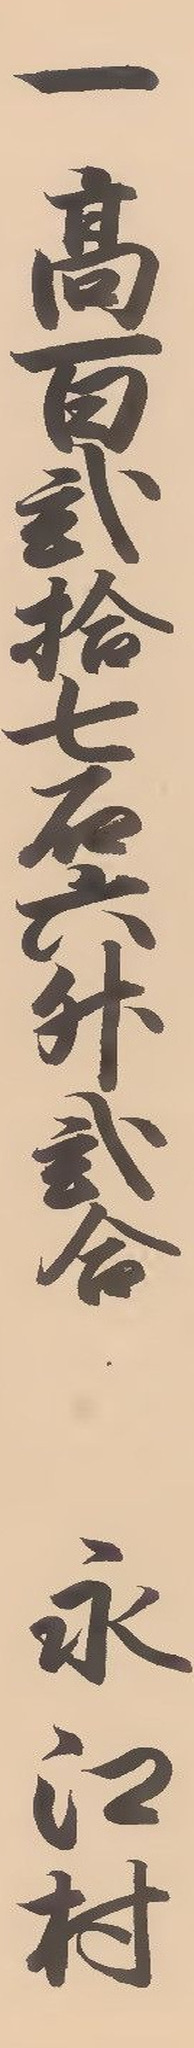一高百弐拾七石六升弐合永江村
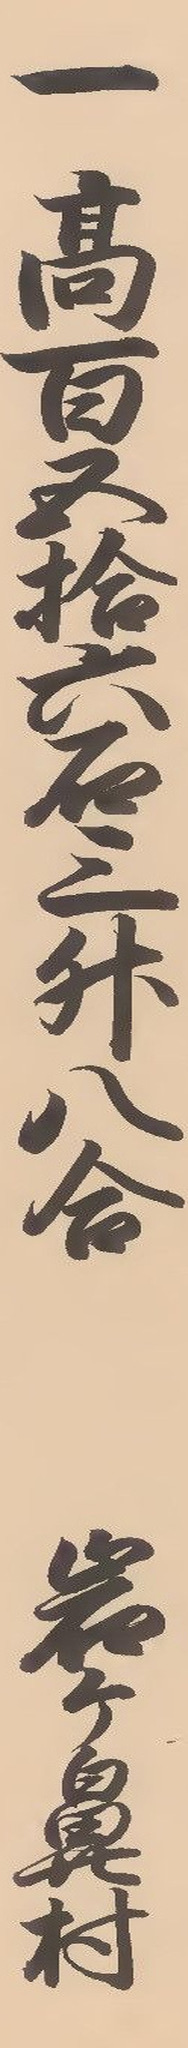一高百五拾六石三升八合岩ヶ鼻村
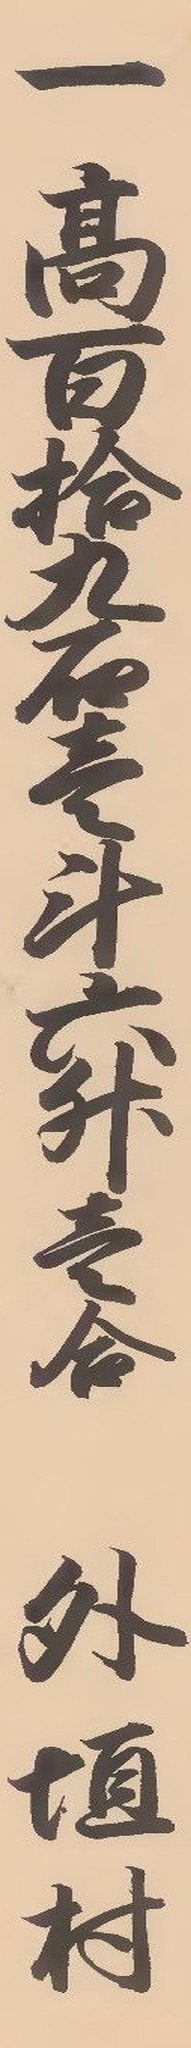一高百拾九石壱斗六升壱合外垣村
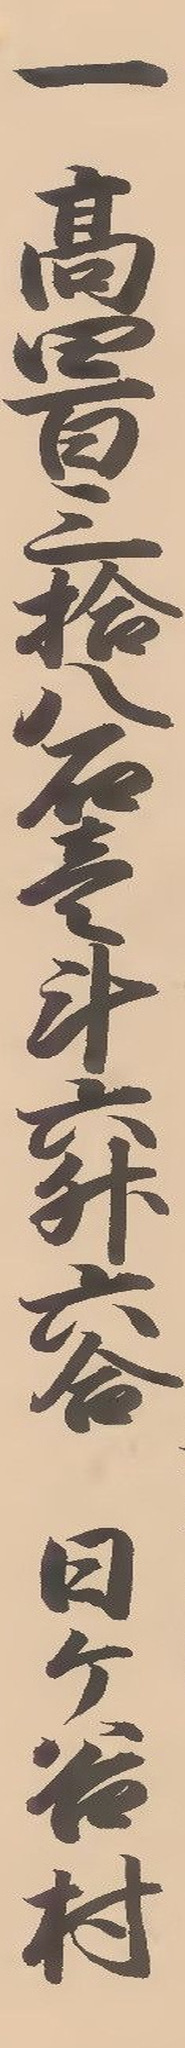一高四百三拾八石壱斗六升六合日ヶ谷村
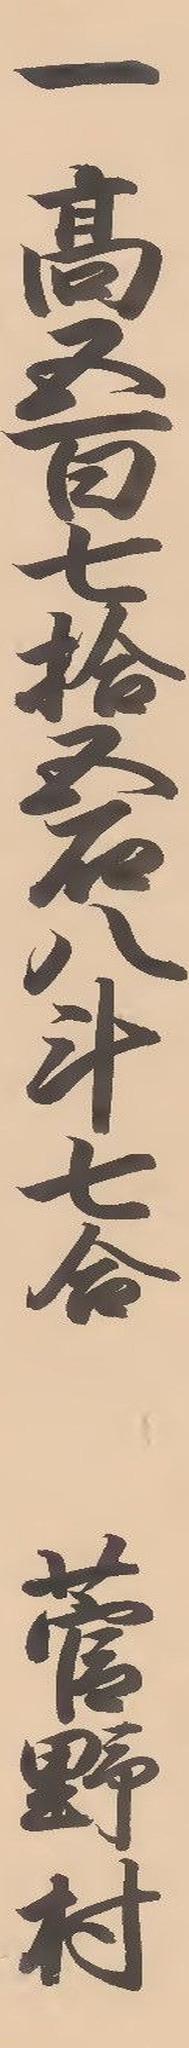一高五百七拾五石八斗七合菅野村
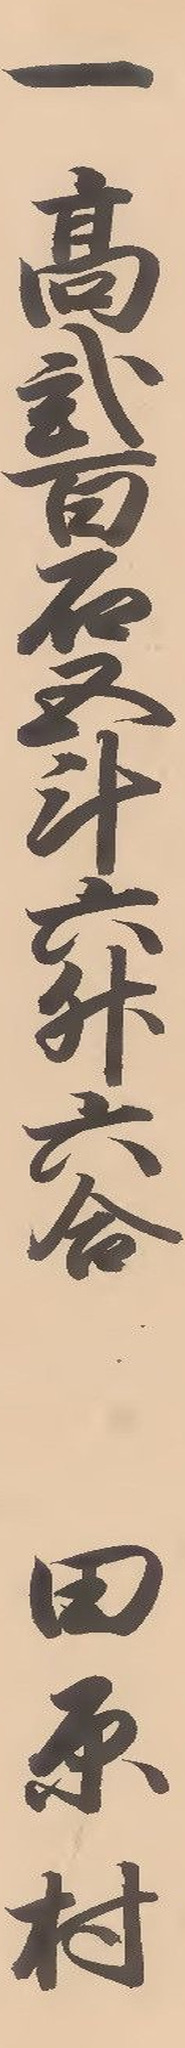一高弐百石五斗六升六合田原村
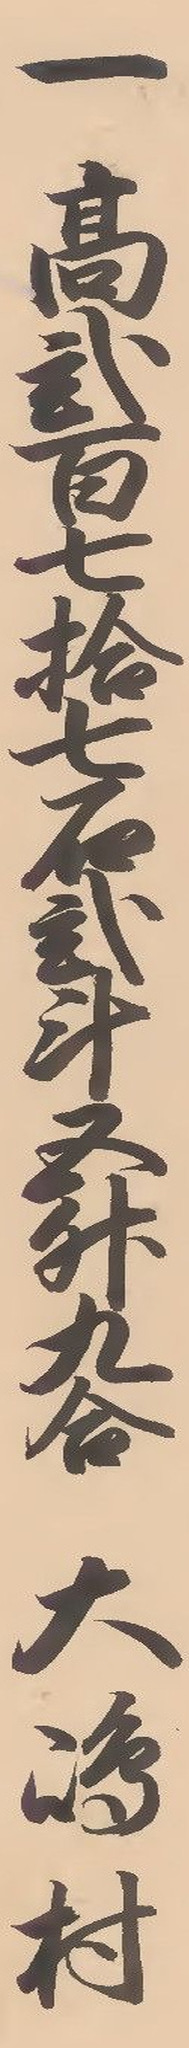一高弐百七拾七石弐斗五升九合大嶋村

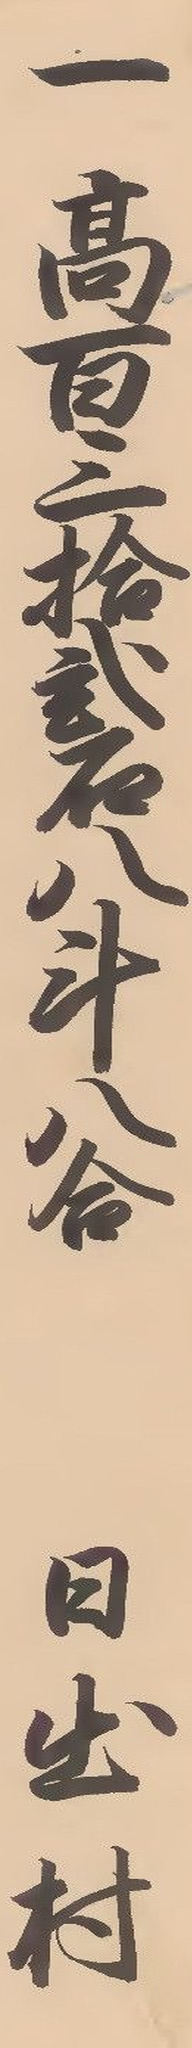一高百三拾弐石八斗八合日出村
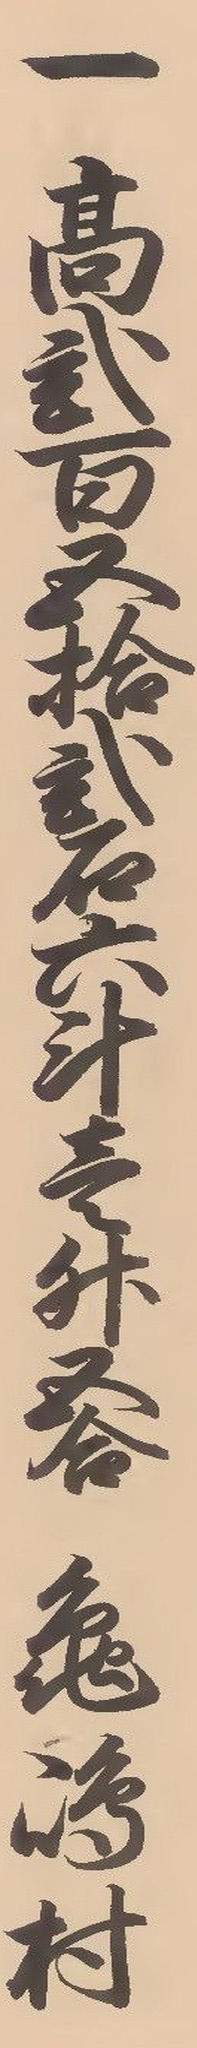一高弐百五拾弐石六斗壱升五合亀嶋村
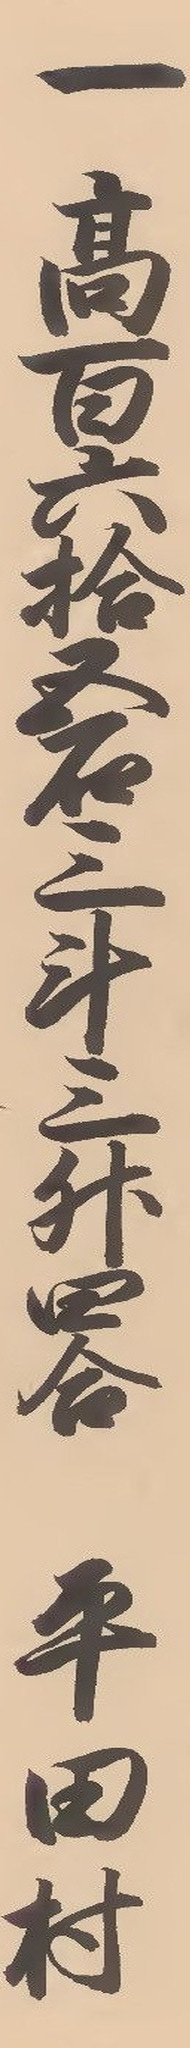一高百六拾五石三斗三升四合平田村
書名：丹後国郷帳
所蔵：国立公文書館 National Archives of Japan
